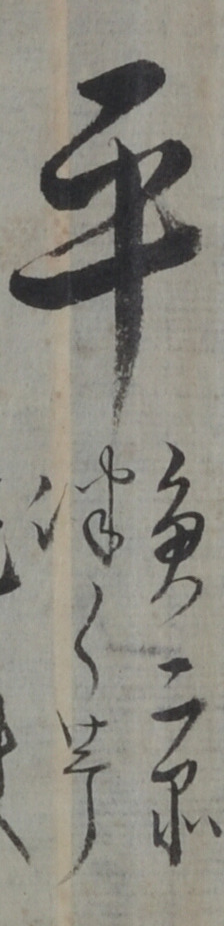平魚二品
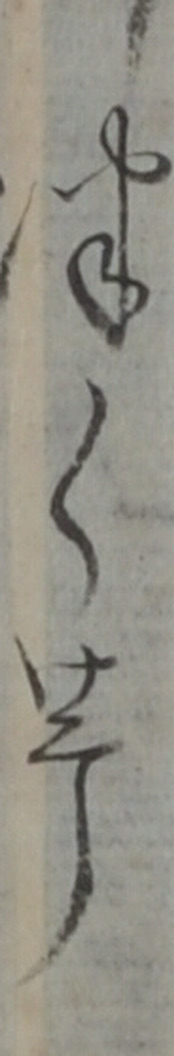つく芋
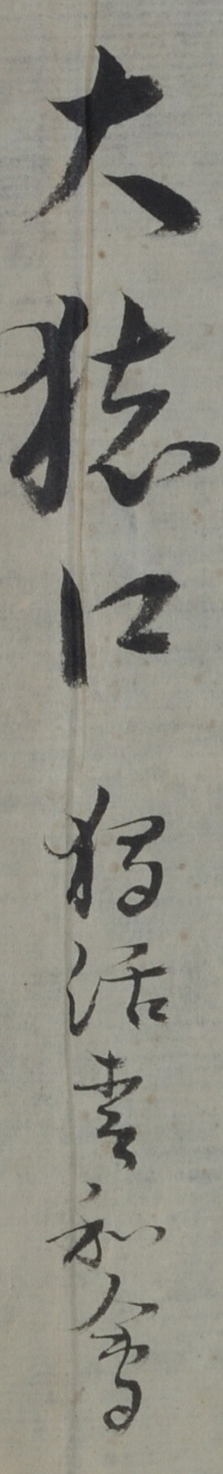大猪口独活青和会
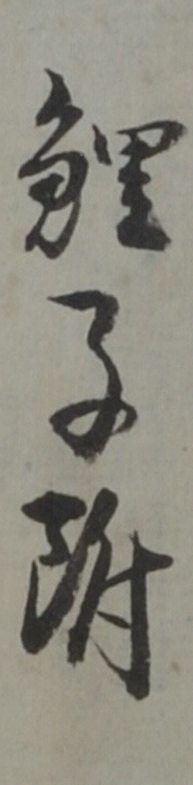鯉子附
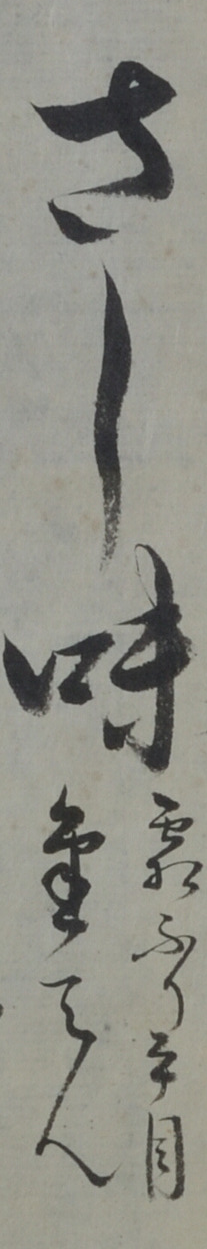さし味霜ふり平目
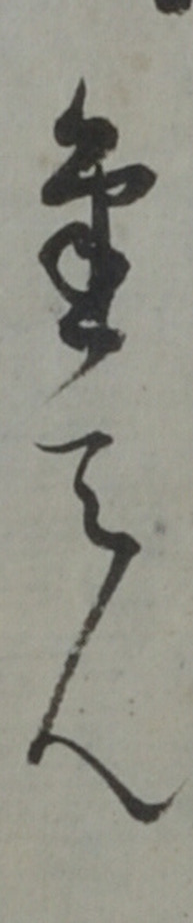金てん
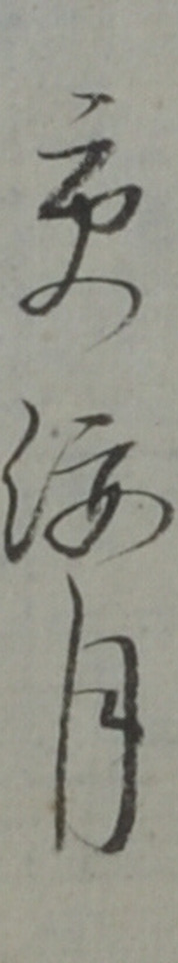交海月
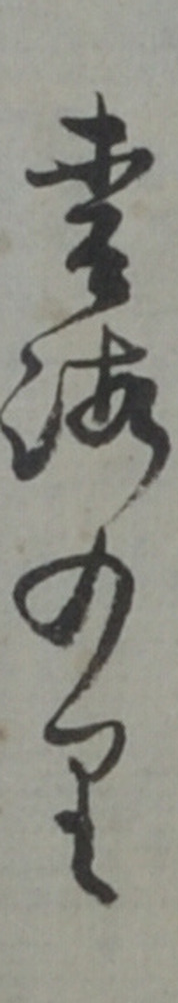青海のり
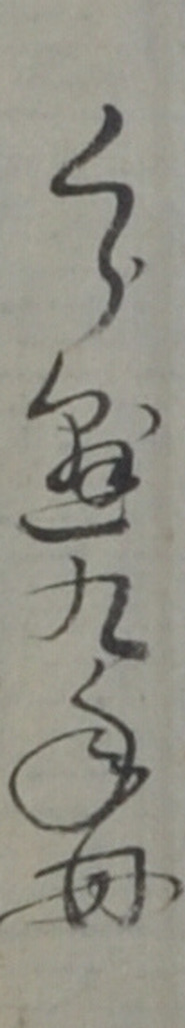くら懸九年母
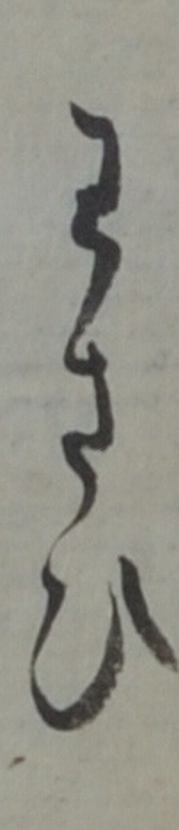わさひ
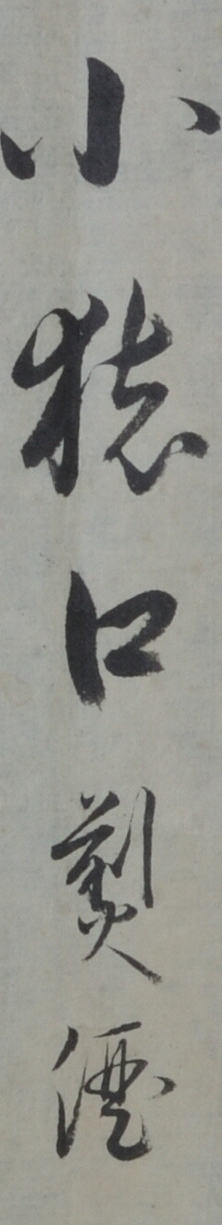小猪口煎酒

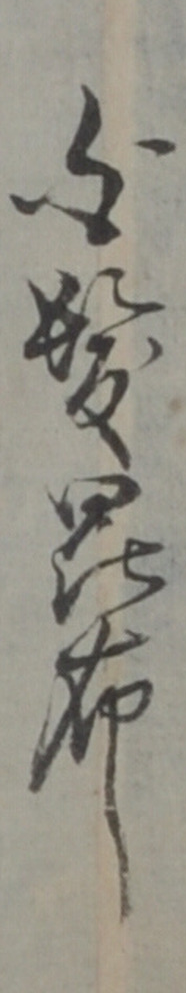白髪昆布
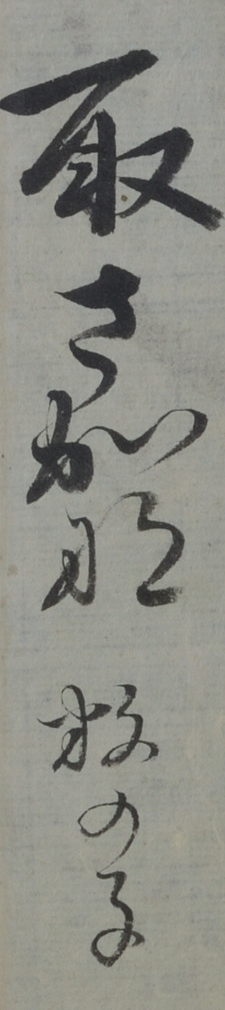取さかな数の子
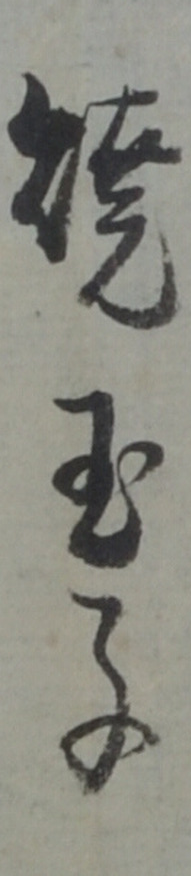焼玉子
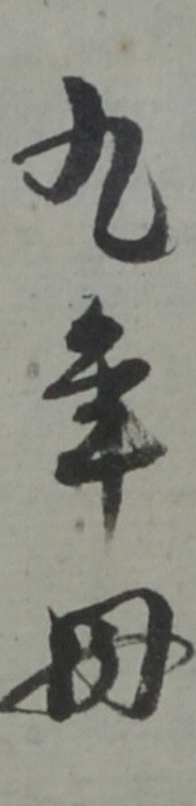九年母
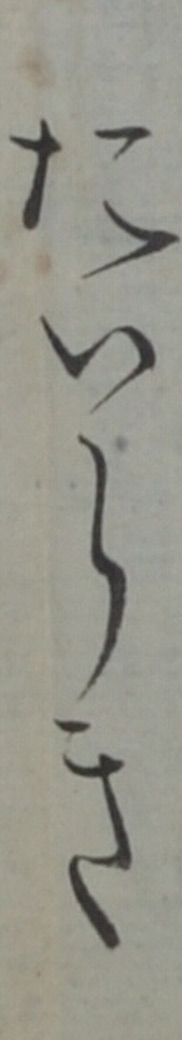たいらき
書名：献立書上
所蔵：伊那市立高遠町図書館・合同会社AMANE
